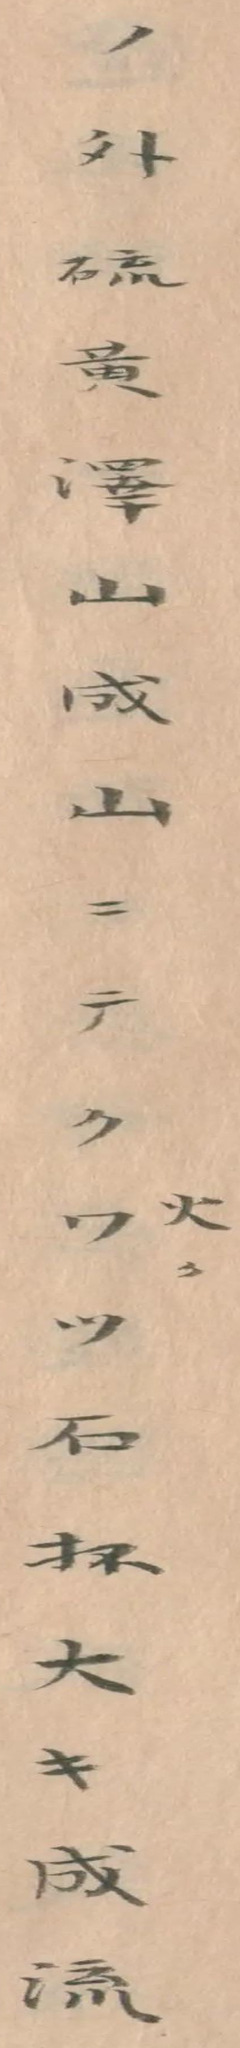ノ外硫黄澤山成山ニテクワツ石抔大キ成流
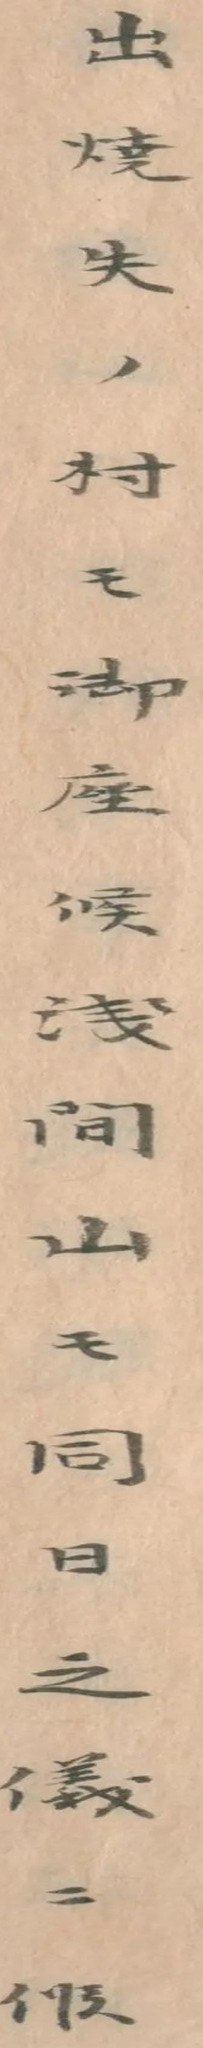出焼失ノ村モ御座候浅間山モ同日之儀二候

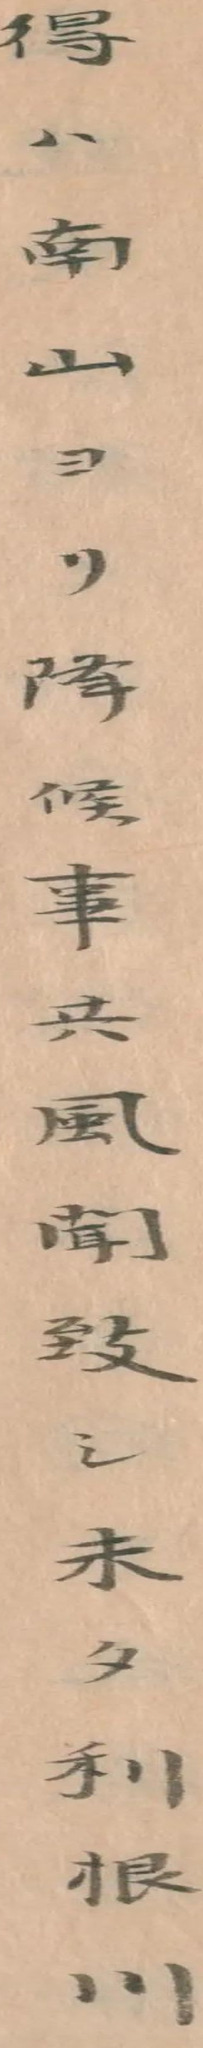得ハ南山ヨリ降候事共風聞致シ未タ利根川
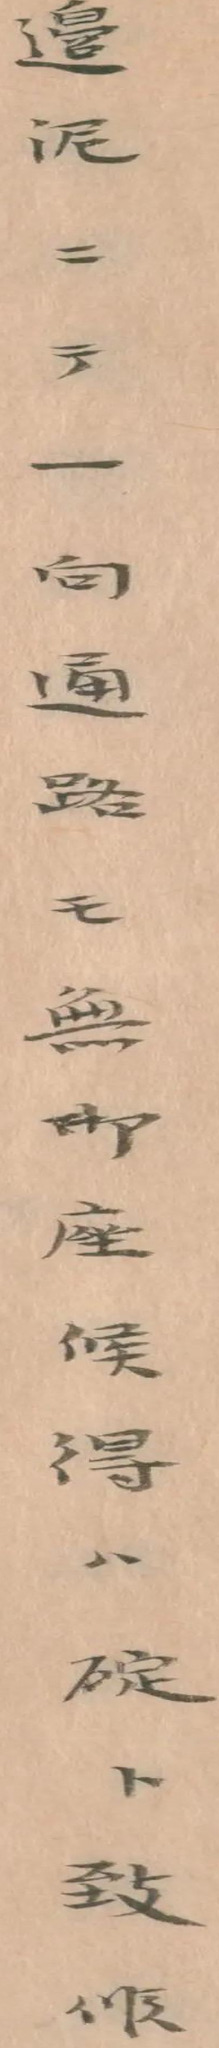辺泥ニテ一向通路モム御座候得ハ̪碇ト致候
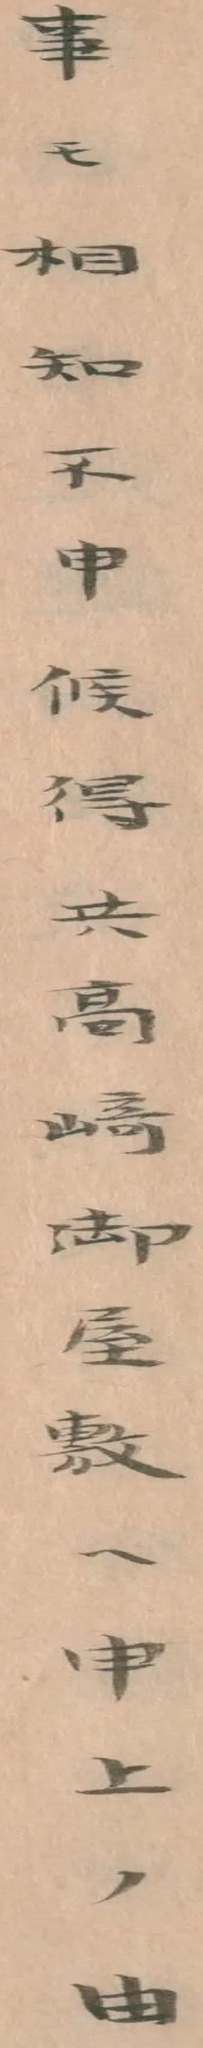事モ相知不申候得共高崎御屋敷へ申上ノ由
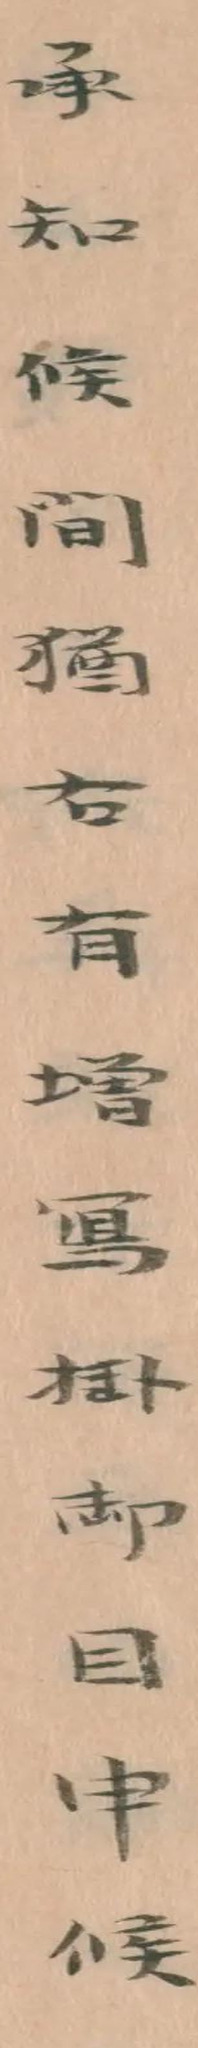承知候間猶右有増写掛御目申候
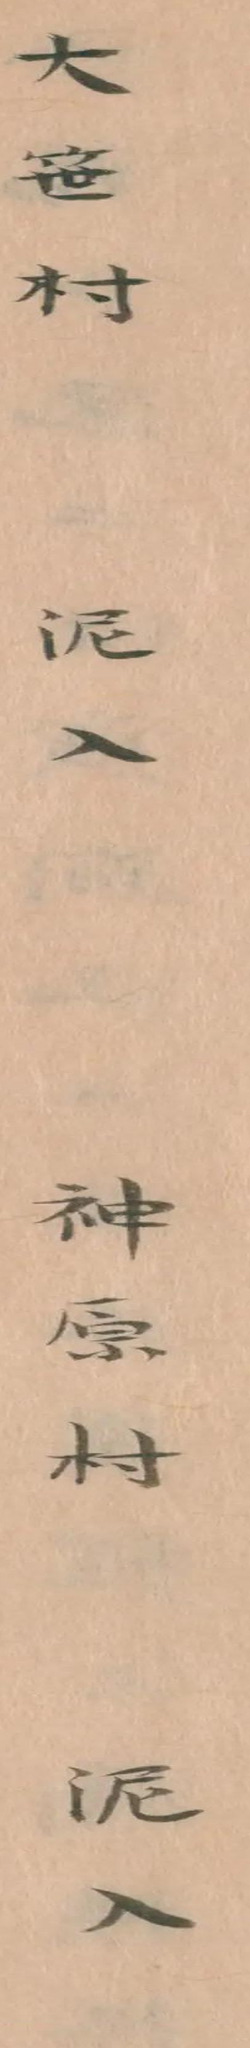大笹村泥入神原村泥入
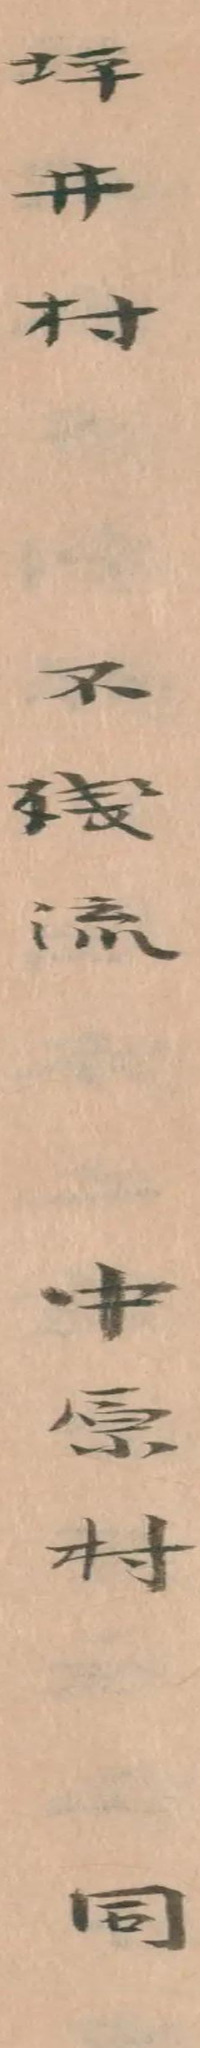坪井村不残流中原村同
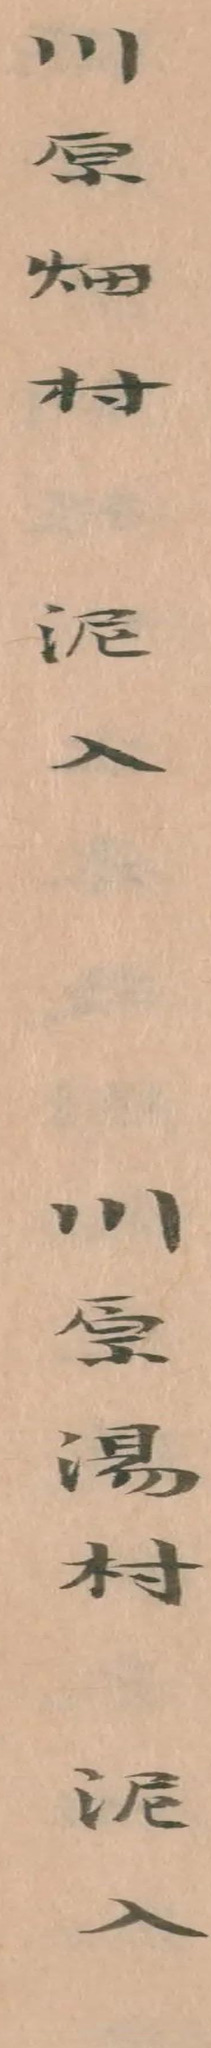川原畑村泥入川原湯村泥入
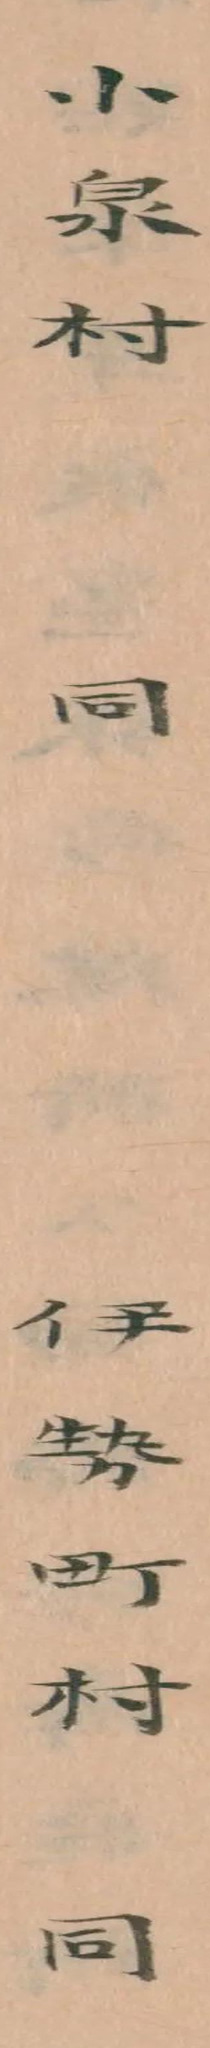小泉村同伊勢町村同
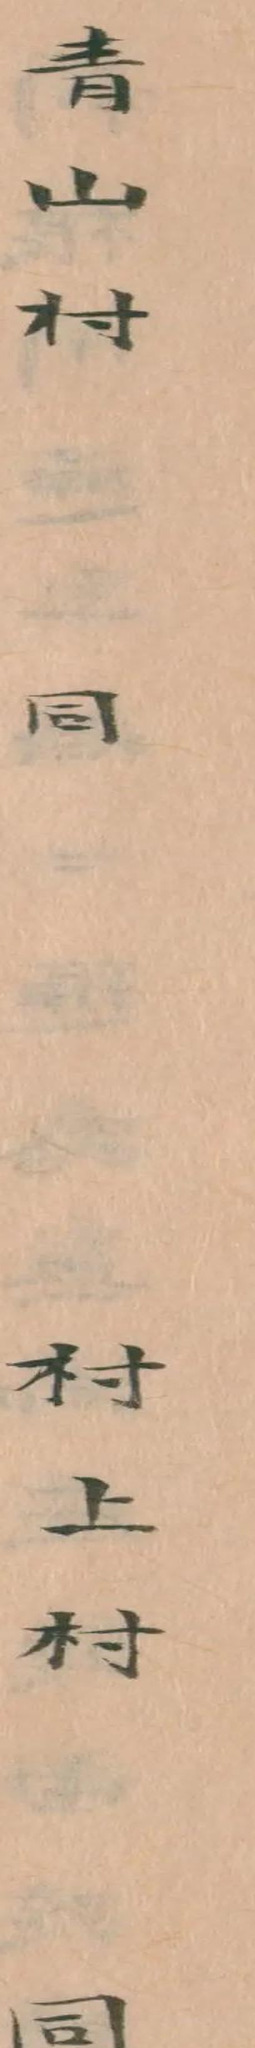青山村同村上村同
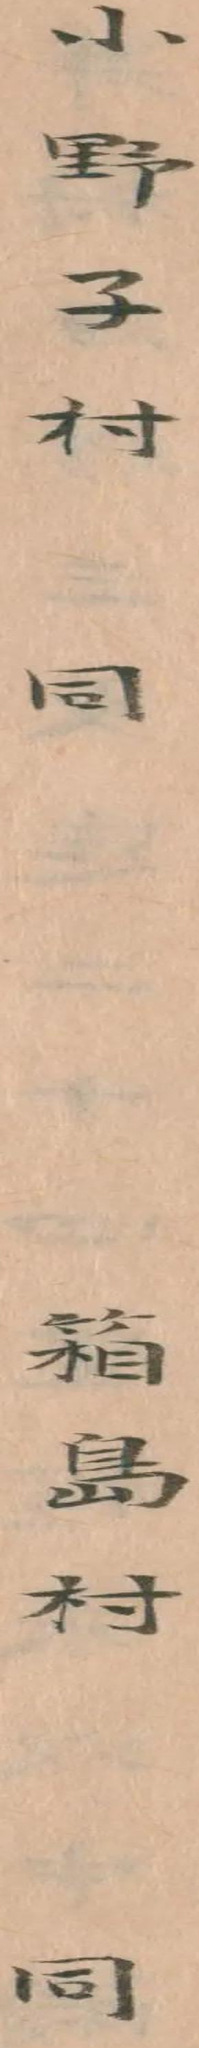小野子村同箱島村同
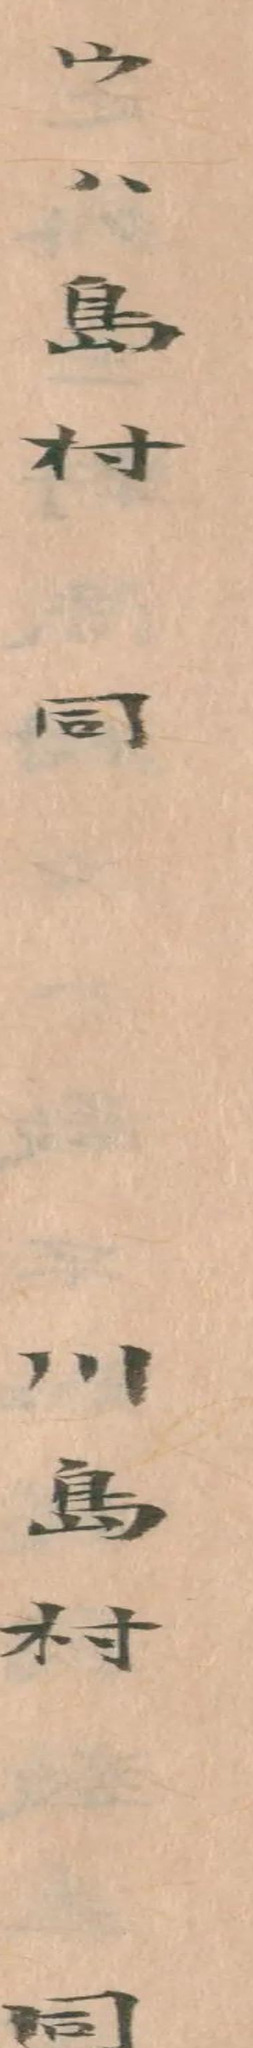ウハ島村同川島村同
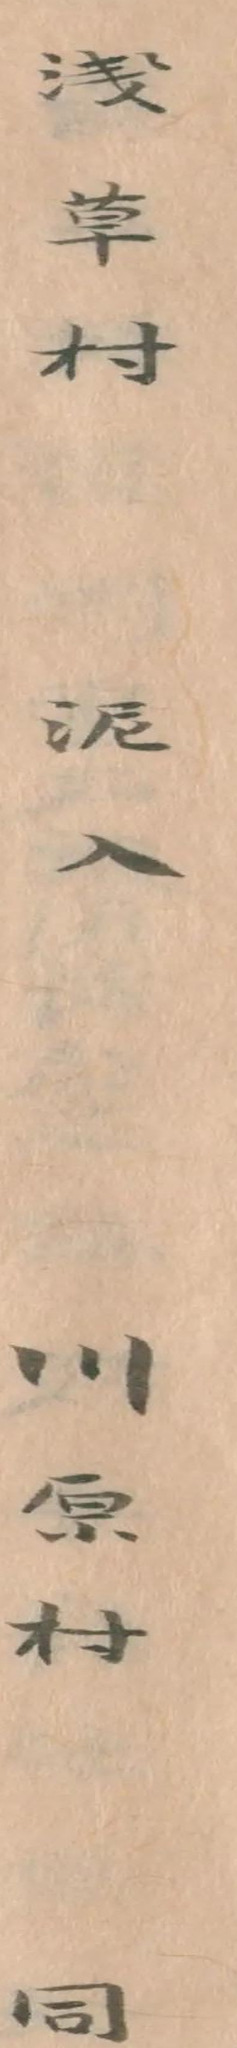浅草村泥入川原村同
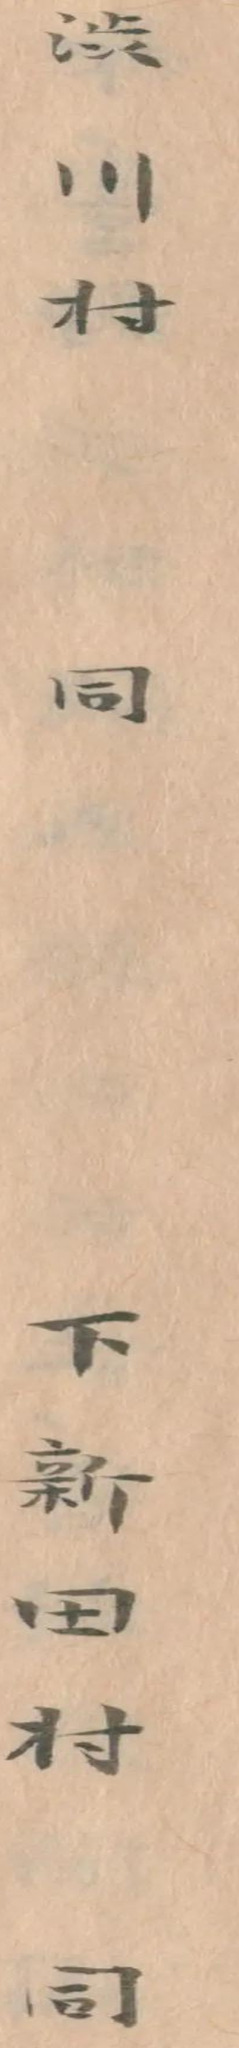渋川村同下新田村同
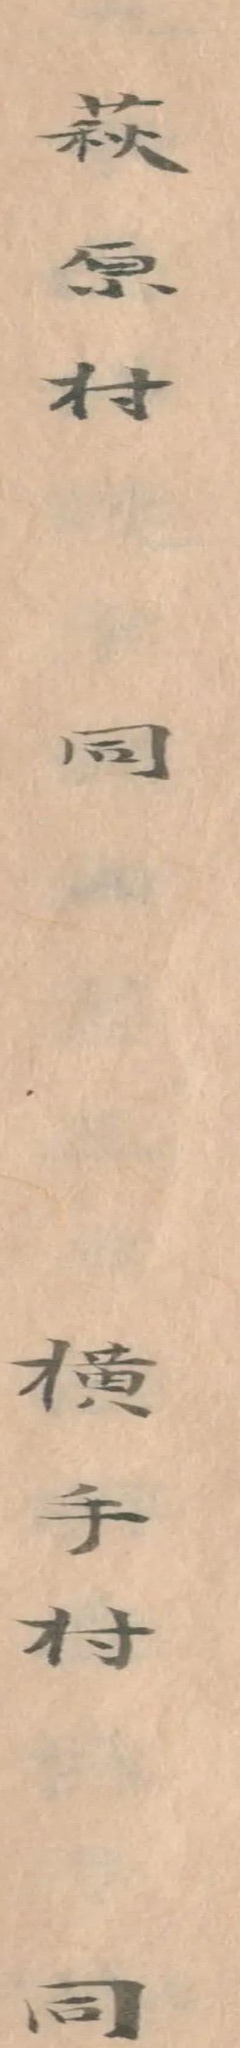萩原村同横手村同
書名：地災撮要. 巻1(噴火山・地震ノ部)
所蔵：国立国会図書館 National Diet Library, JAPAN
